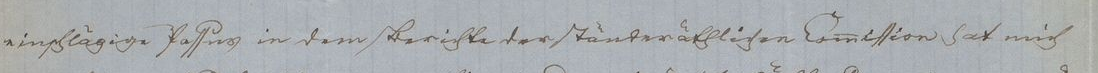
einschlägige Passus in dem Berichte der ständeräthlichen Commission hat mich
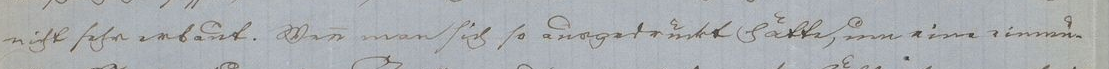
nicht sehr erbaut. Wenn man sich so ausgedrükt hätte, um eine einmü-
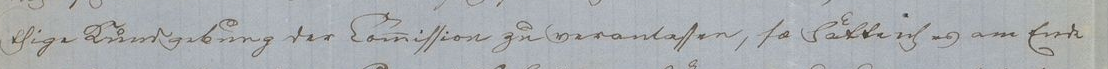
thige Kundgebung der Commission zu veranlassen, so hätte ich es am Ende
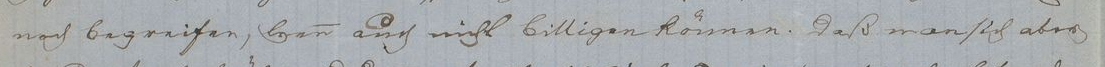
noch begreifen, wenn auch nicht billigen können. Daß man sich aber
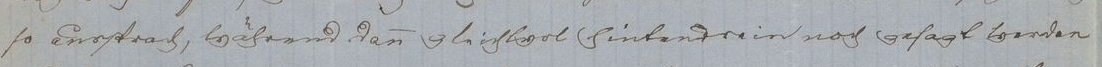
so aussprach, während dann gleichwohl hintendrein noch gesagt werden
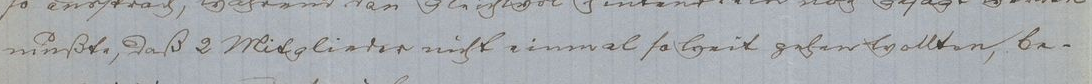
mußte, daß 2 Mitglieder nicht einmal so weit gehen wollten, be-
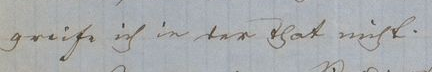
greife ich in der That nicht.
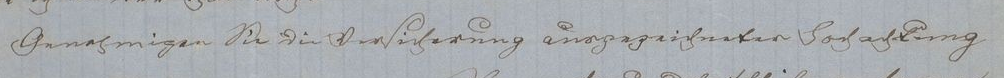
Genehmigen Sie die Versicherung ausgezeichneter Hochachtung
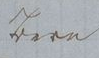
Bern
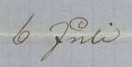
6 Juli
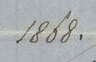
1868.
